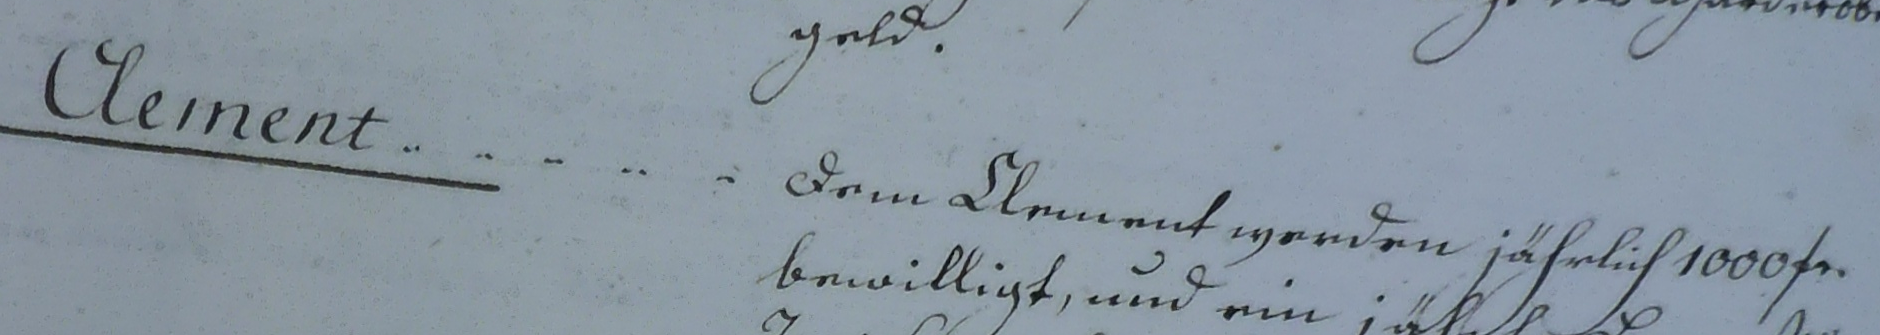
Clement .. .. .. .. .. Dem Clement werden jährlich 1000fr.
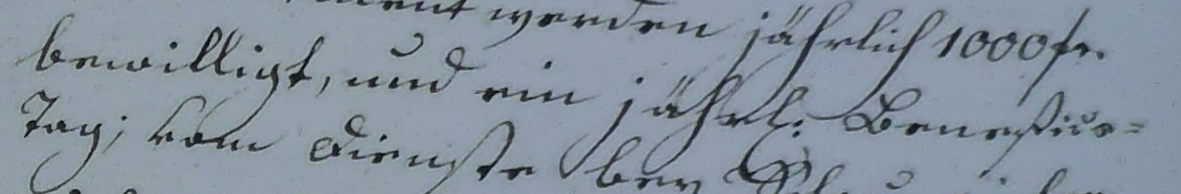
bewilligt, und ein jährl. Benefice=
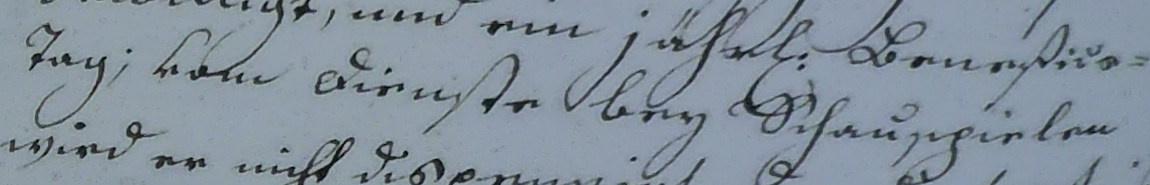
Tag, vom Dienste bey Schauspielen
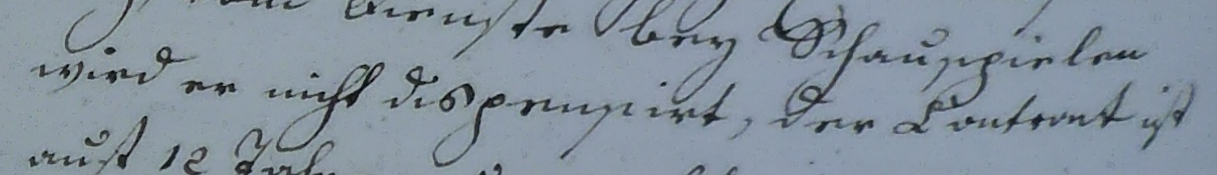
wird er nicht dispensirt, der Contract ist
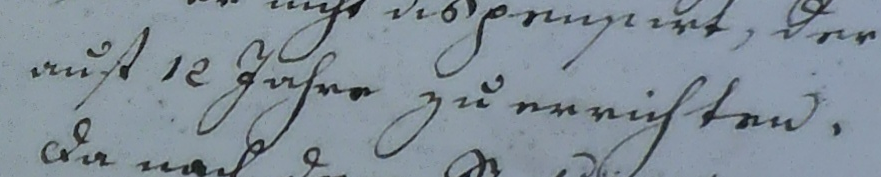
auf 12 Jahre zu errichten.
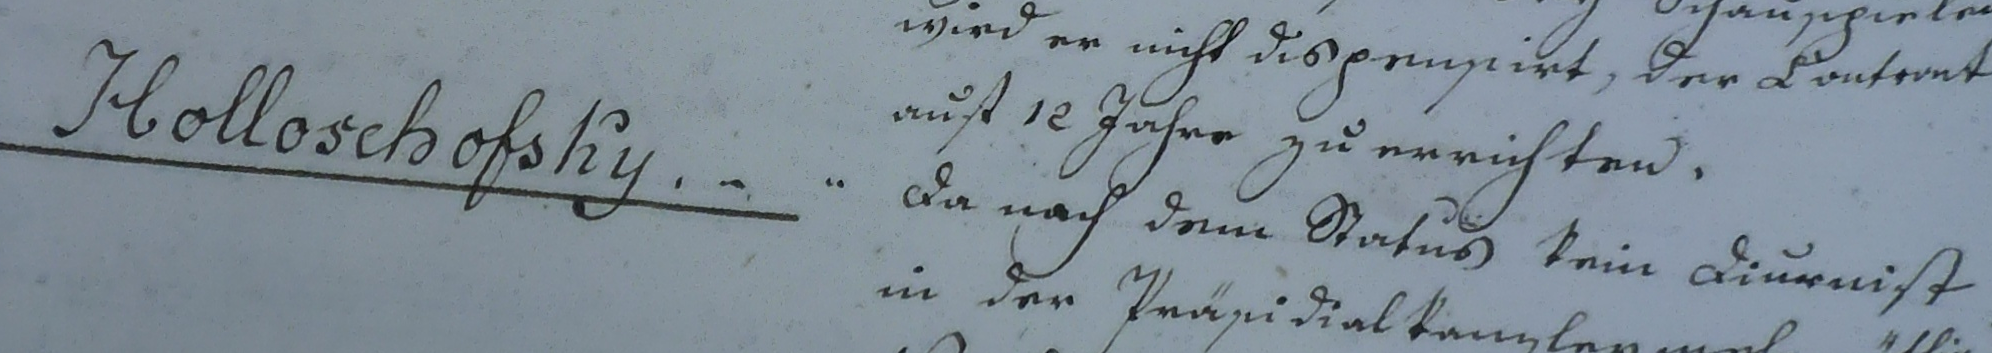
Holloschofsky. .. Da nach dem Status kein Acurnist
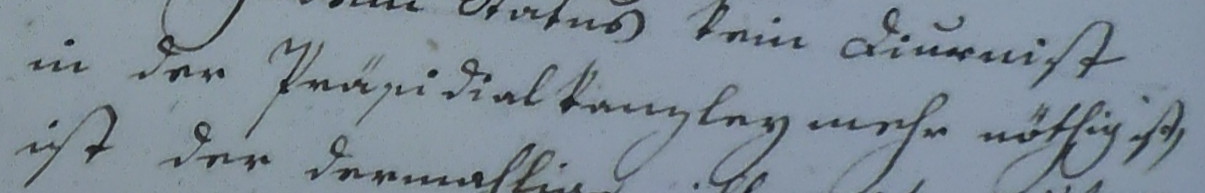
in der Präsidialkanzley mehr nöthig ist
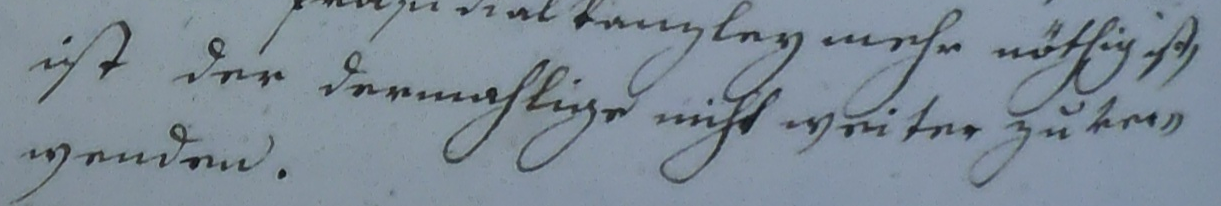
ist der dermahlige nicht weiter zu ver¬
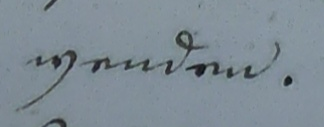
wenden.
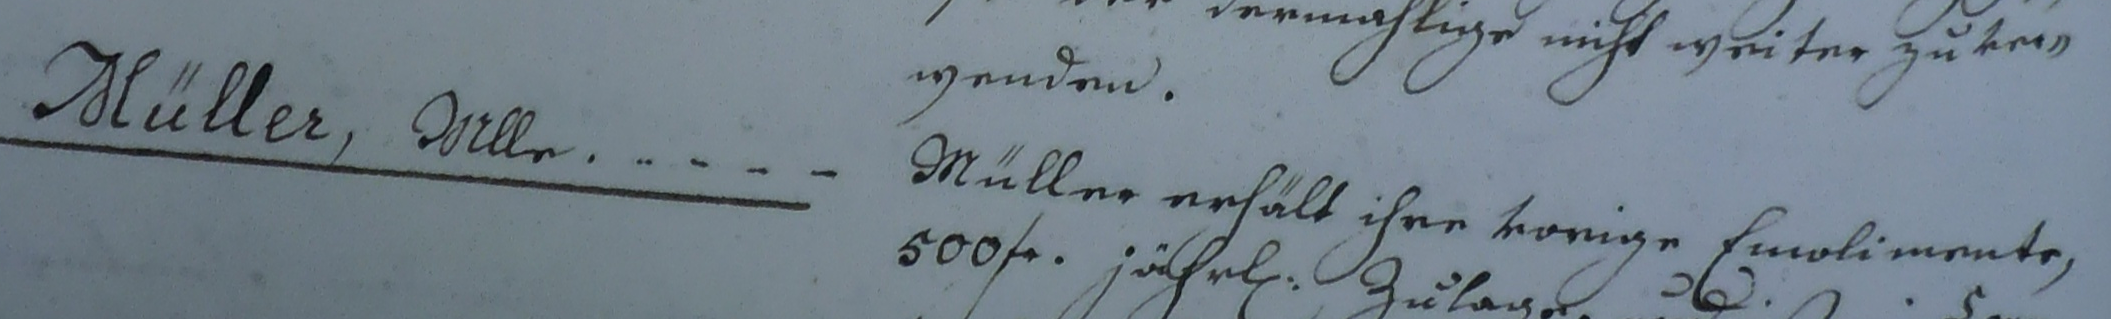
Müller, Mlle. .. .. .. .. Müller erhält ihre vorige Emolimente,
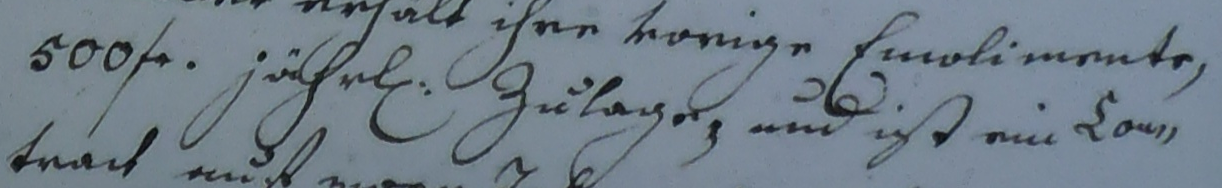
500fr. jährlE Zulage, und ist ein Con¬
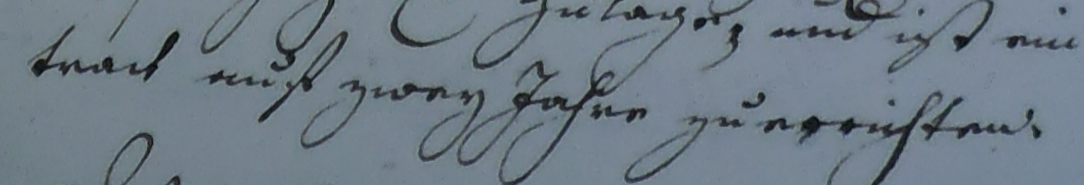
tract auf zwey Jahre zuerrichten.
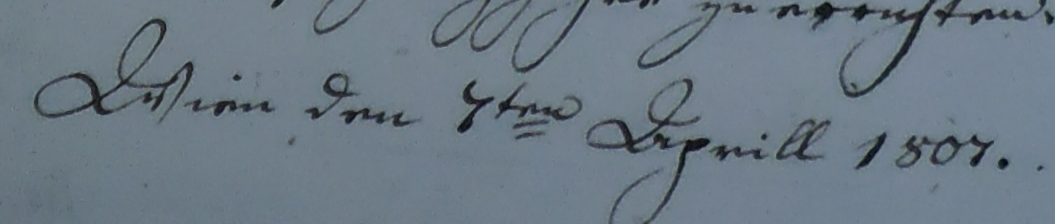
Wien den 7te͇n Aprill 1807.
